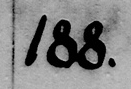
10–25.
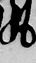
lb.
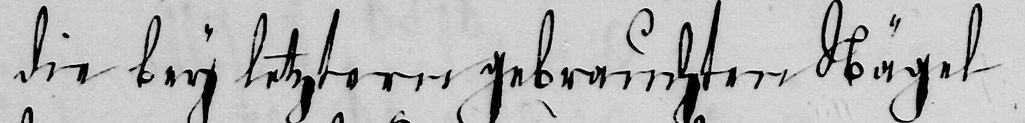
die bey letztern gebrauchten Nägel
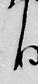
1.
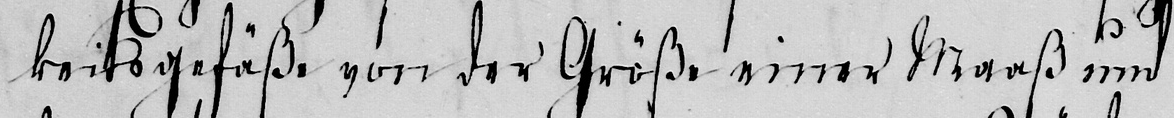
keitsgefäße von der Größe einer Maaß und
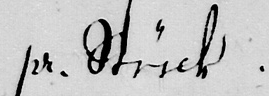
pr. Stück
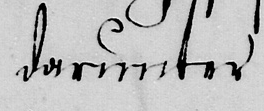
darunter
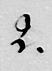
2.
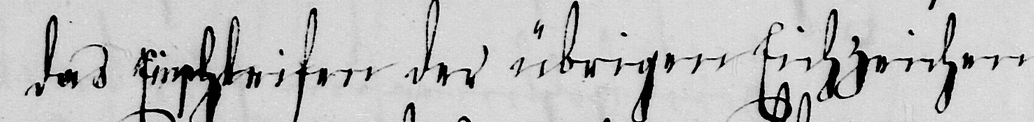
das Einschleifen der übrigen Eichzeichen
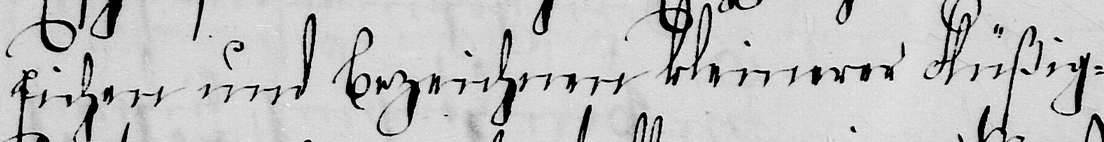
Eichen und Bezeichnen kleinerer Flüßig¬
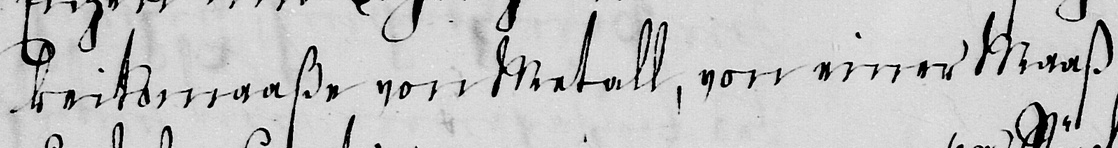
keitsmaaße von Metall, von einer Maaß
